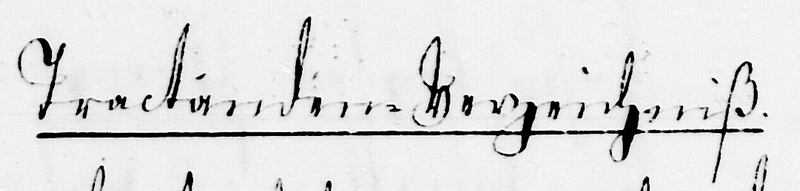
Tractanden-Verzeichniß.
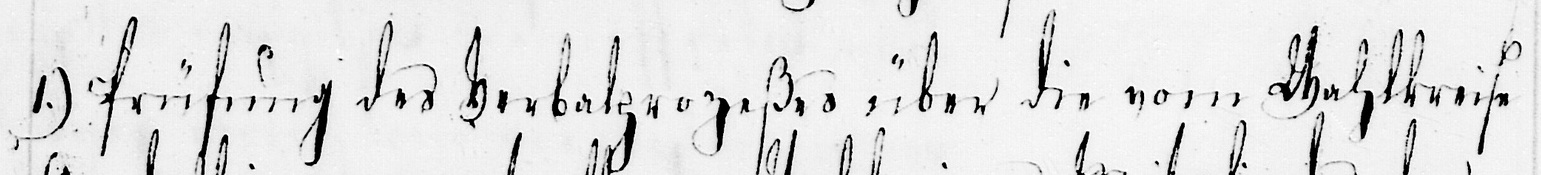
1.) Prüfung des Verbalprozeßes über die vom Wahlkreise
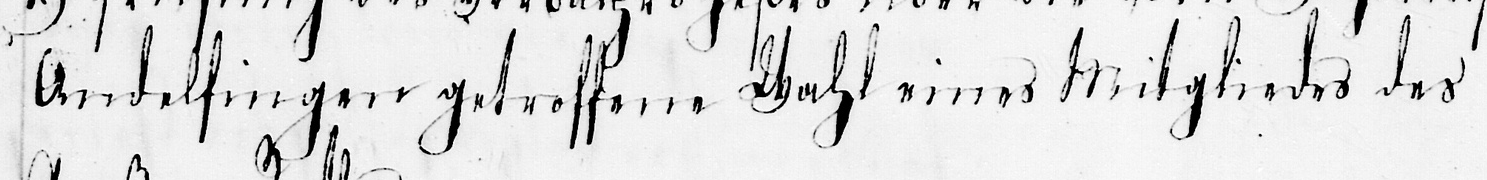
Andelfingen getroffene Wahl eines Mitgliedes des
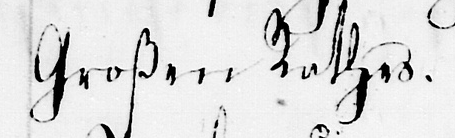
Großen Rathes.
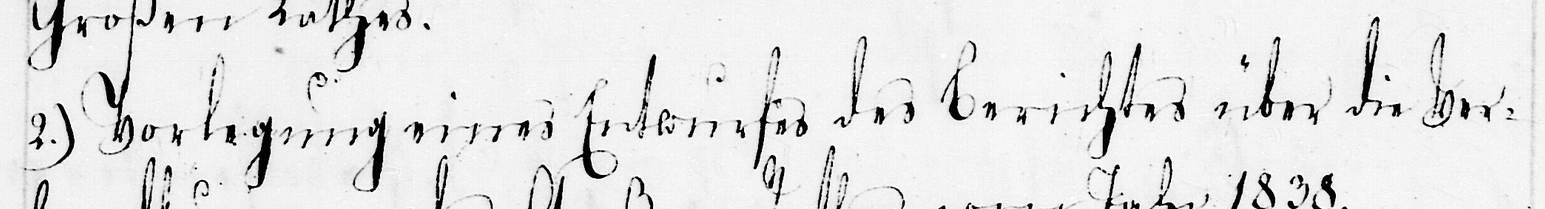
2.) Vorlegung eines Entwurfes des Berichtes über die Ver¬
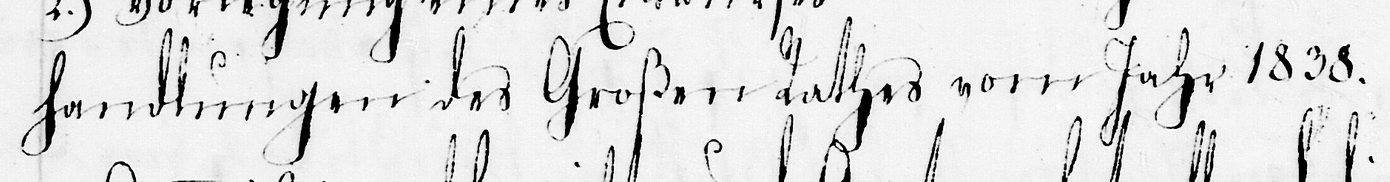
handlungen des Großen Rathes vom Jahr 1838.
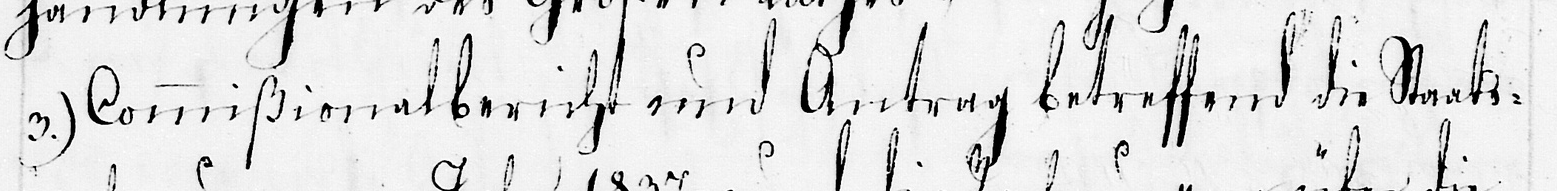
3.) Commißionalbericht und Antrag betreffend die Staat¬
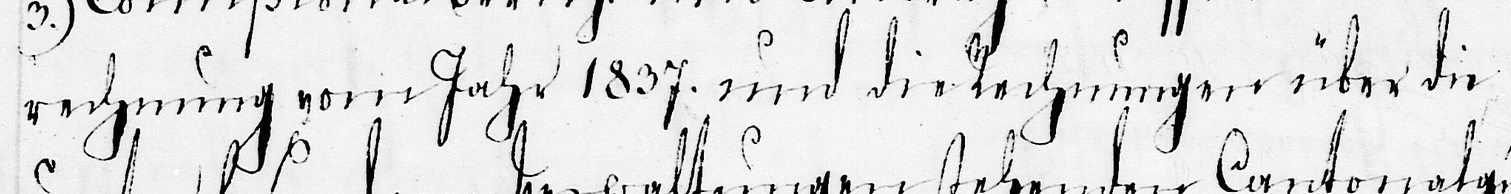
srechnung vom Jahr 1837. und die Rechnungen über die
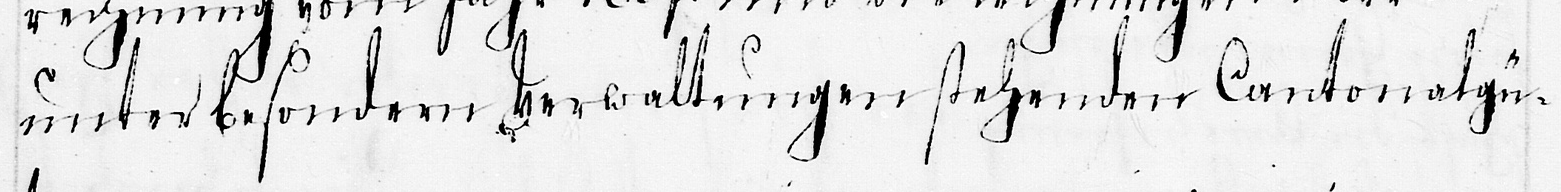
unter besondern Verwaltungen stehenden Cantonalgü¬
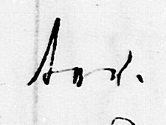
ter.
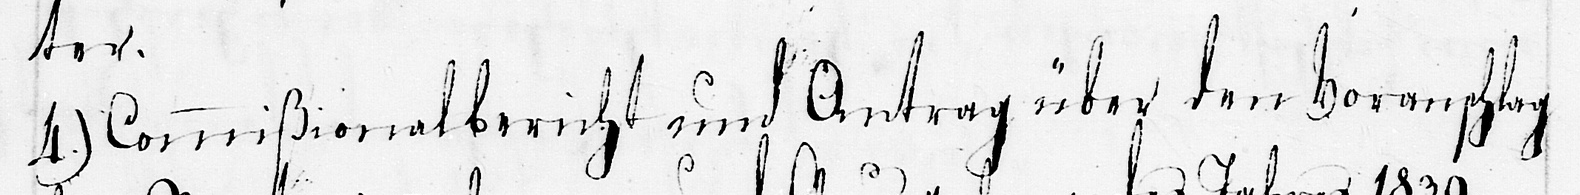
4.) Commißionalbericht und Antrag über den Voranschlag
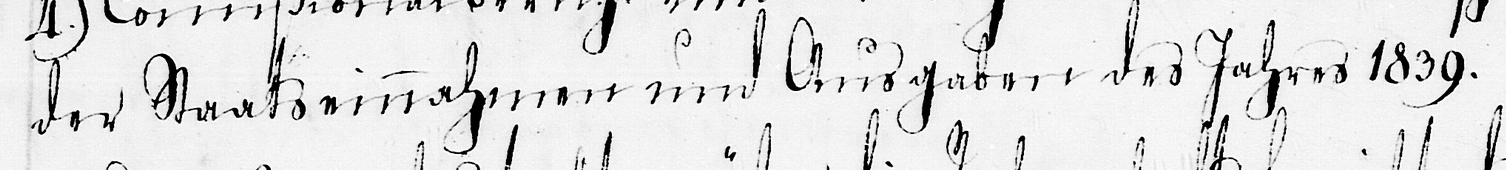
der Staatseinnahmen und Ausgaben des Jahres 1839.
